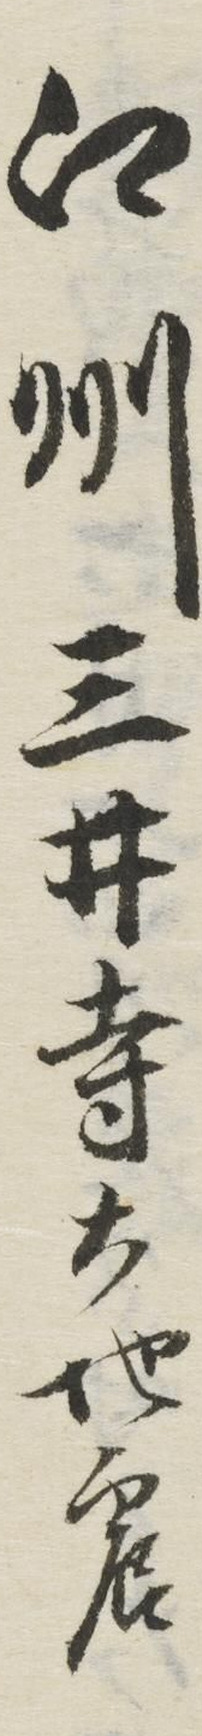江州三井寺大地震
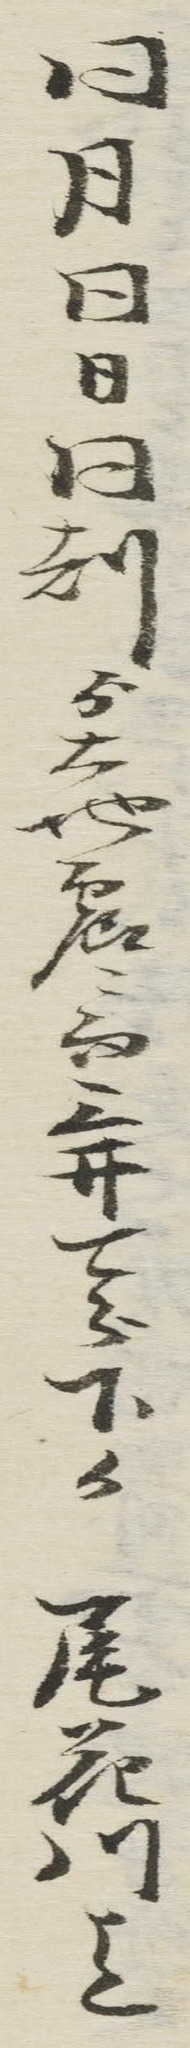同月同日同刻ゟ大地震ニ而三井寺下り尾花川迄
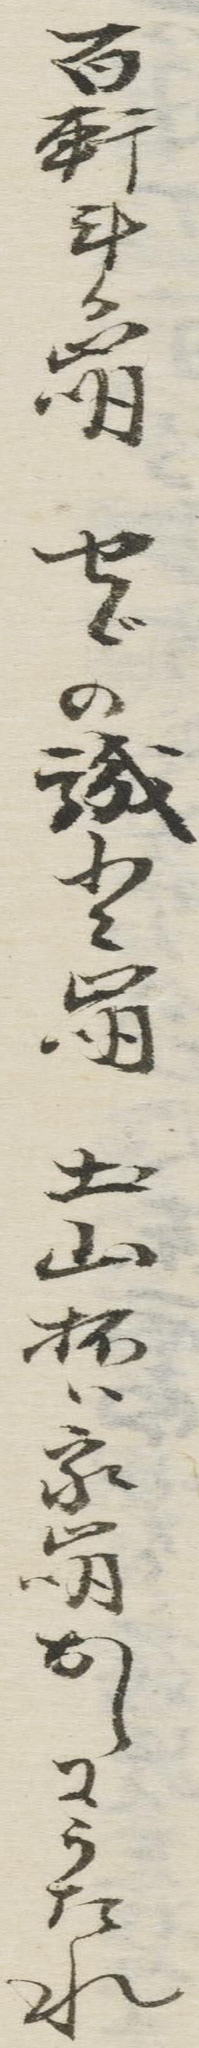百軒斗り崩セゞの城少々崩土山抔ハ家崩出しにうたれ
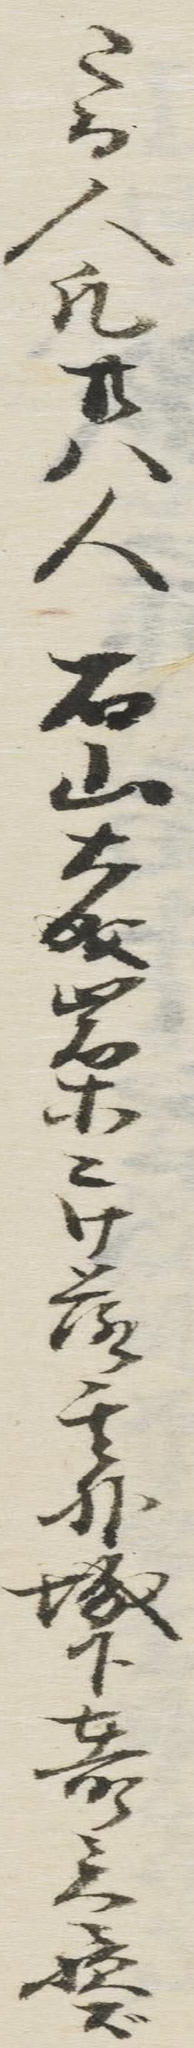たる人凡廿八人石山大成岩等こけ落其外城下在町ニ大ニ損ズ
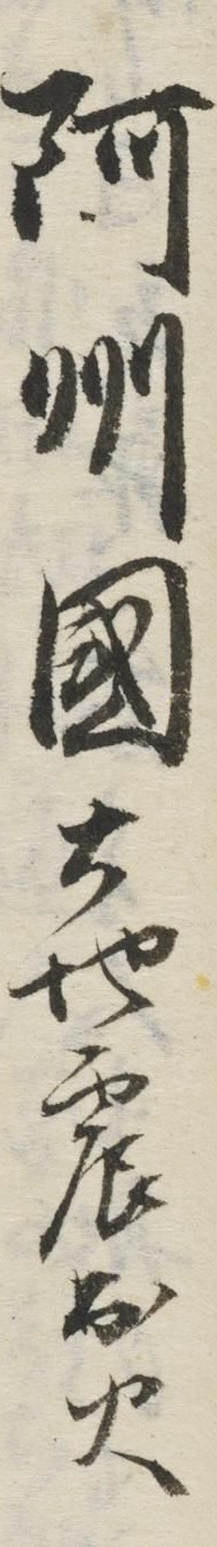阿州国大地震出火
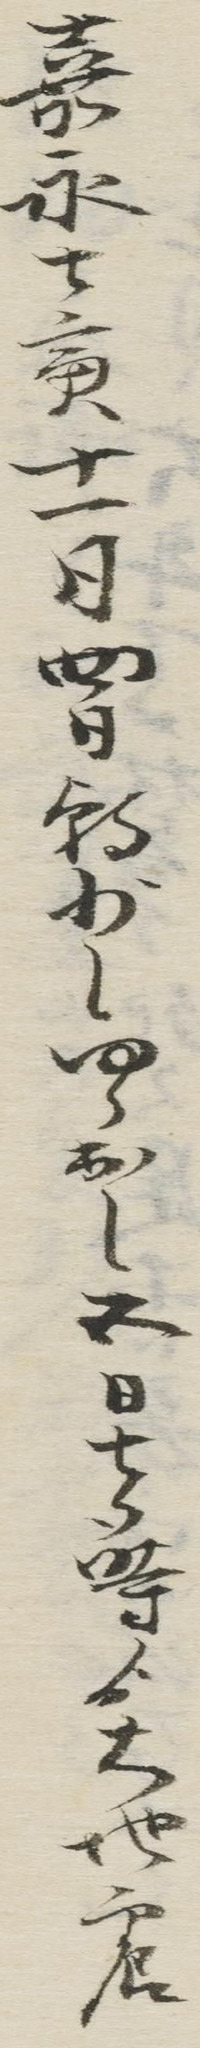嘉永七寅十一月四日朝少々ゆり出し五日七ツ時ゟ大地震
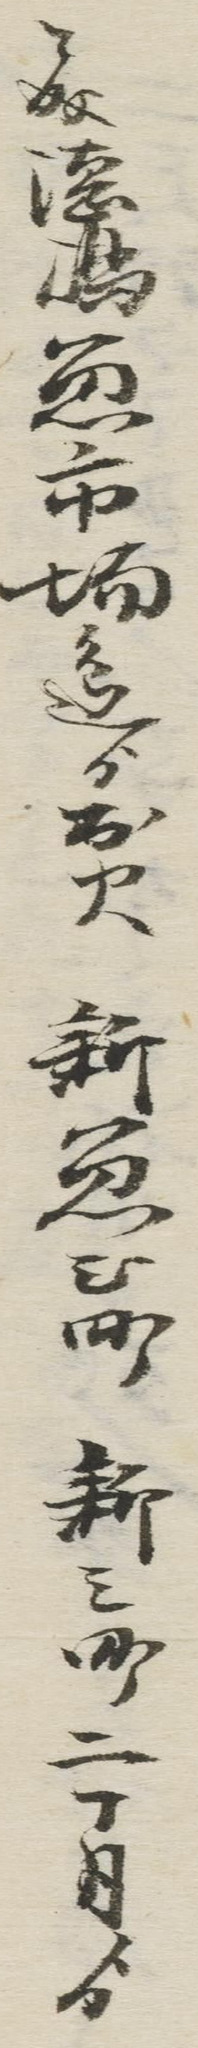ニ成徳嶋魚市場辺ゟ出火新魚屋町新三町二丁目ゟ
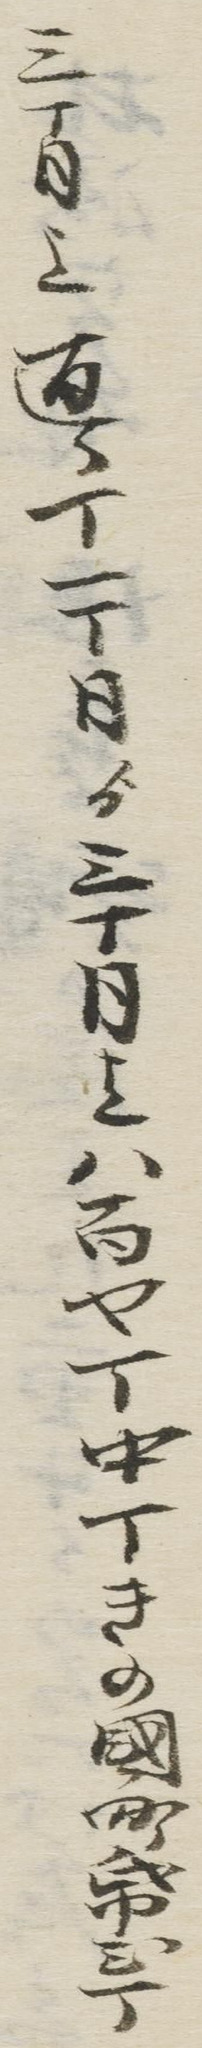三丁目迄通り丁一丁目ゟ三丁目迄八百ヤ丁中丁きの国町紙弐丁
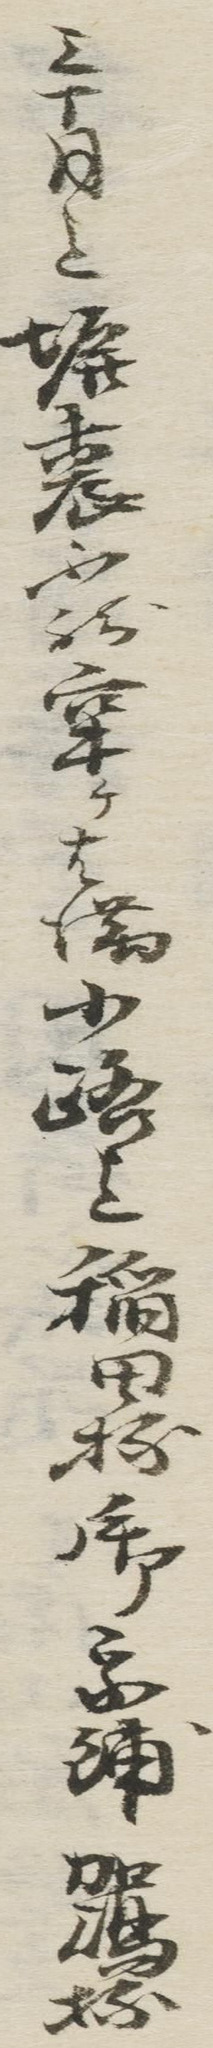三丁目迄塀裏不残穿チはま小路迄稲田様御家舗加嶋様
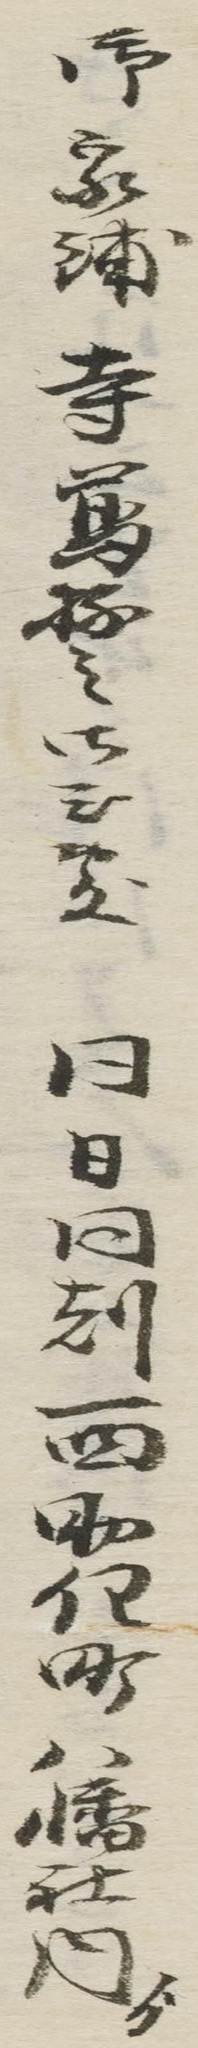御家舗寺嶌様之御屋敷同日同刻西助任町八幡社内ゟ
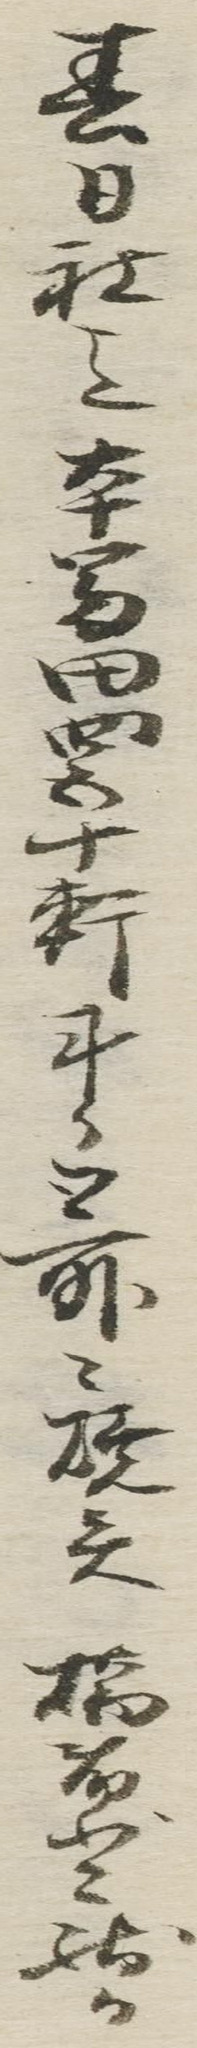春日社迄本富田四五十軒斗り以上所ニ焼失橋者少々残る

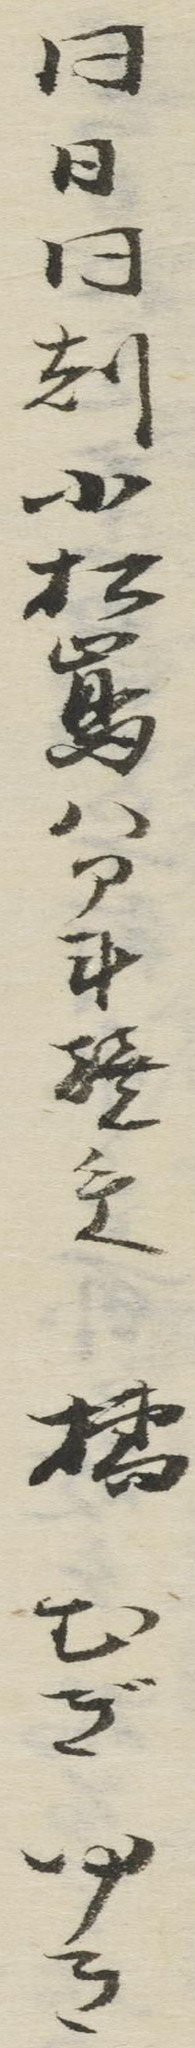同日同刻小松嶌ゟ八部斗焼失橋むぎゆき
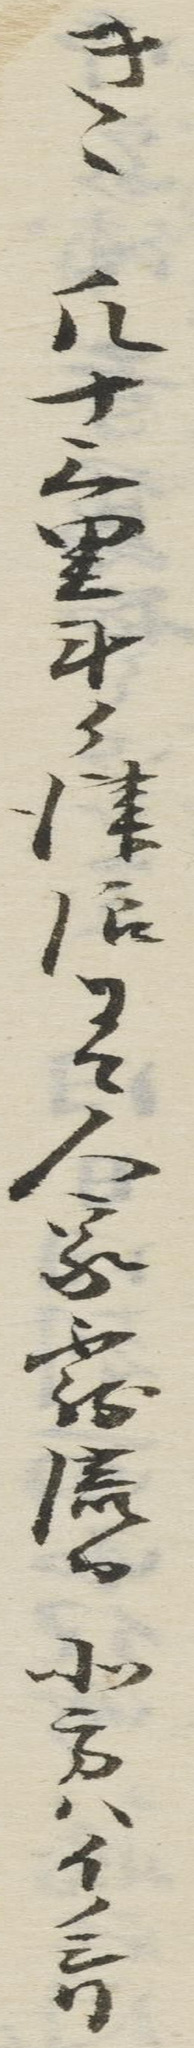きゝ凡十三里斗り津波にて人家不残流る北方ハイノシリ
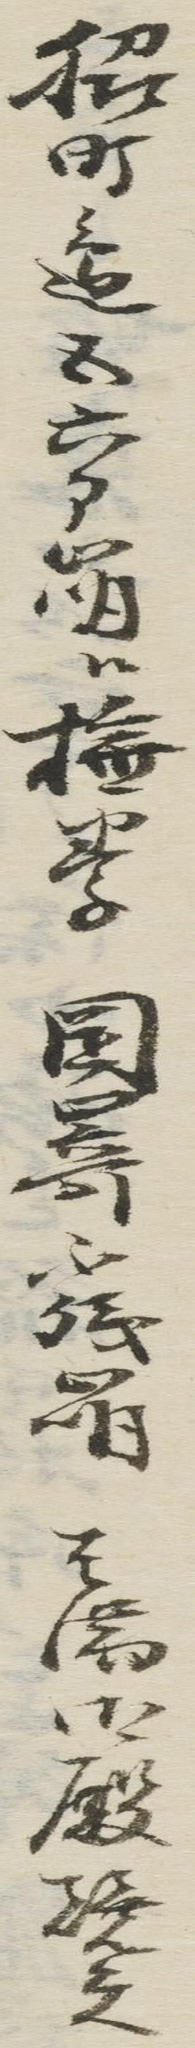脇町辺五六部崩ル撫養岡崎不残崩はま御殿焼失
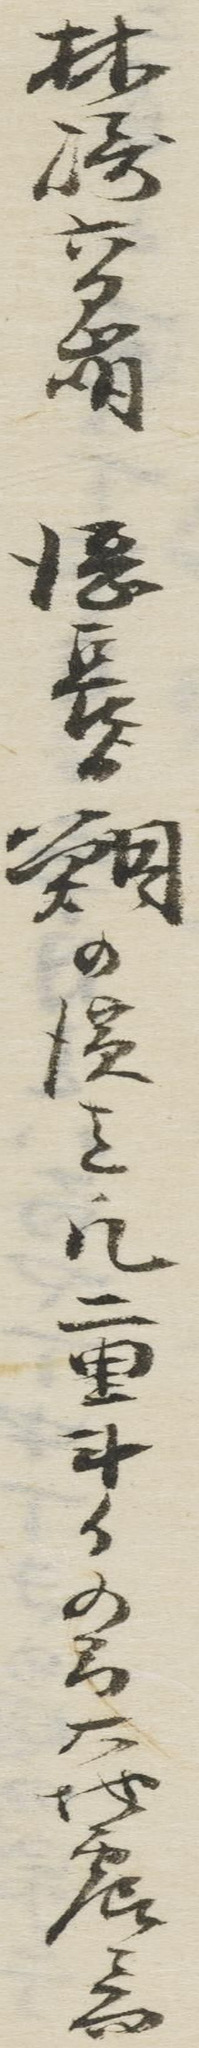林崎六部崩徳長ゟ鯛浜迄凡二里斗りの間大地震ニ而
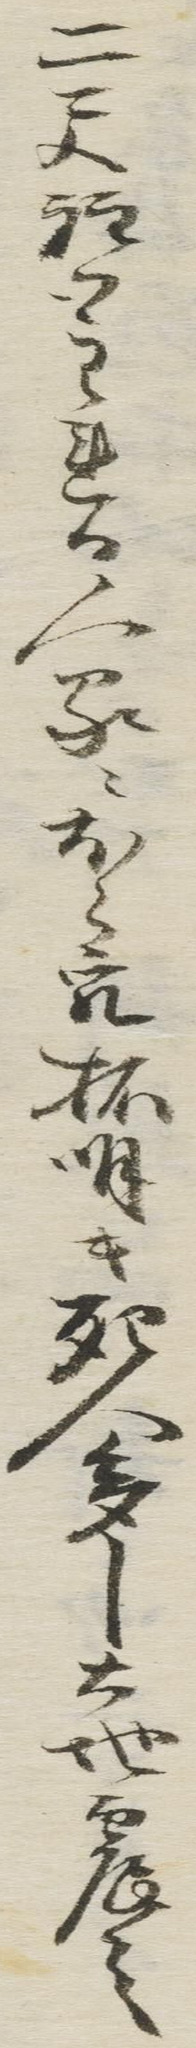二尺程ツゝわれる人家ニほら穴抔明キ死人多し大地震之
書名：諸国大地震大津波一代記
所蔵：東京大学地震研究所図書室 Earthquake Research Institute Library, The University of Tokyo, JAPAN
